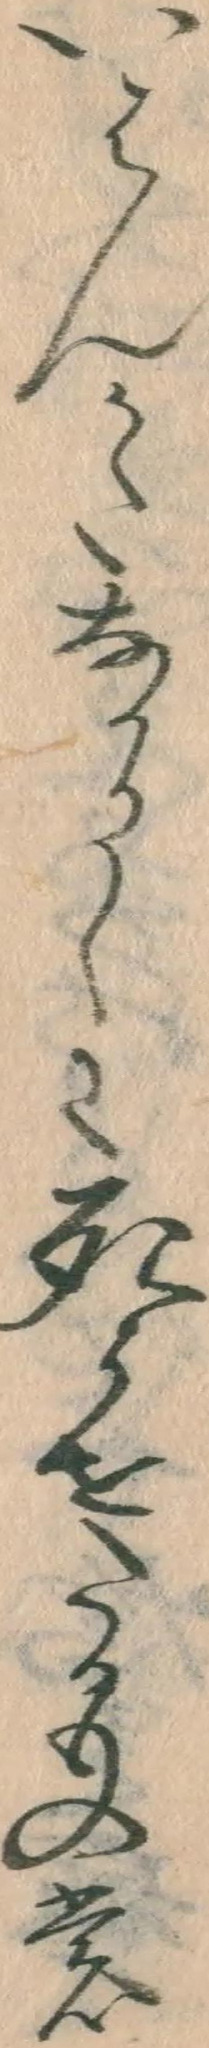いはんかたなかりしに死うせたるものも
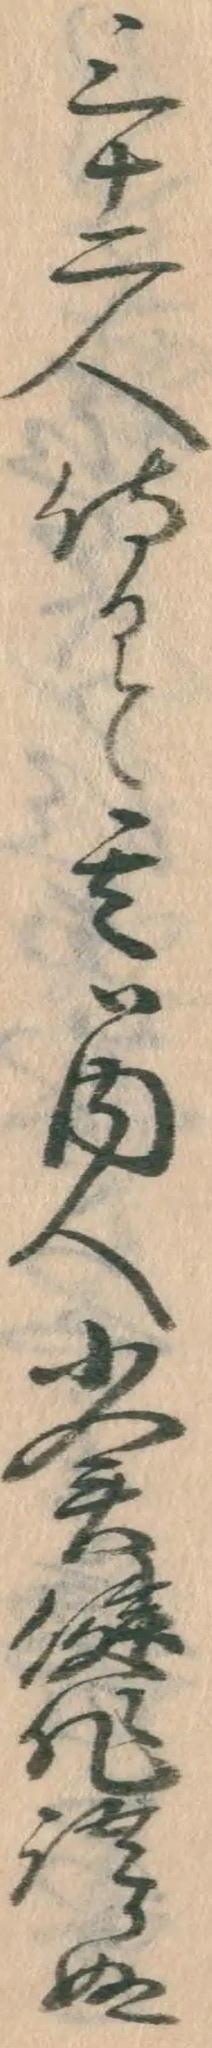三十二人侍ると其御内人小倉健作語りぬ
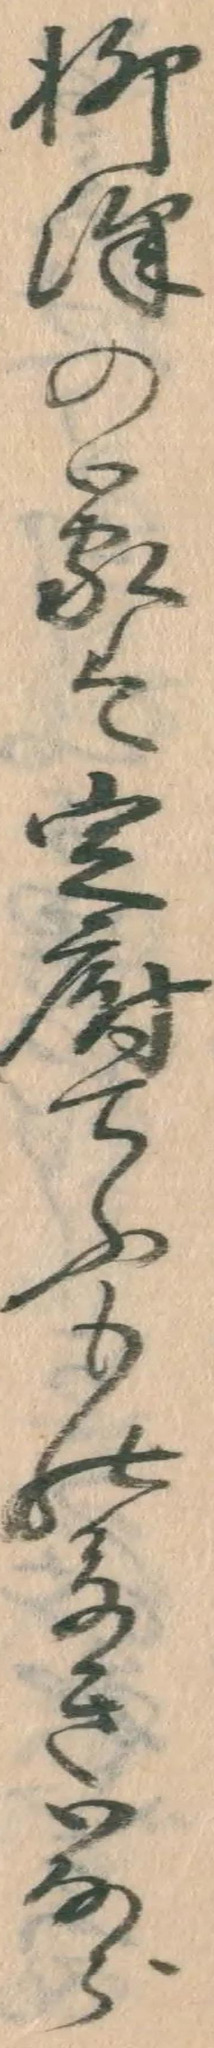柳澤の御家は定府てふもの多き御なら
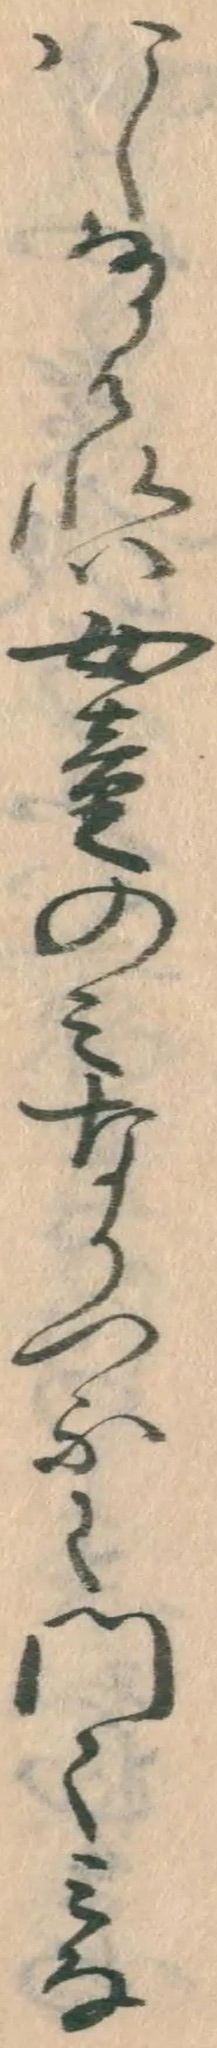ハしなりけれハ女童のミなりつるに門々ミな
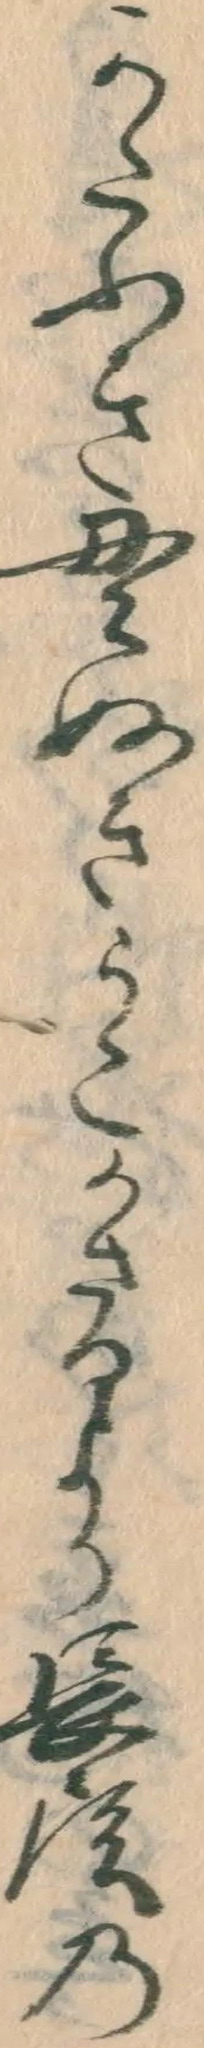かたふき貫ぬきうこかさるより長屋の
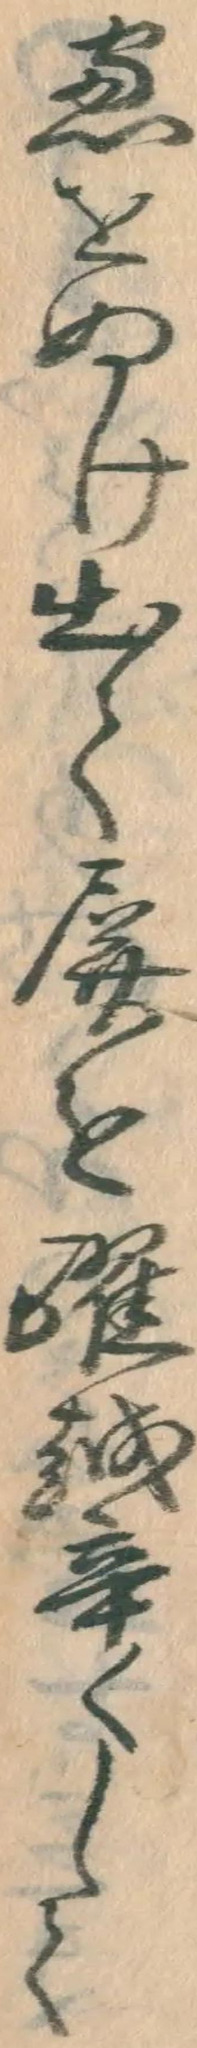窓をぬけ出て屏を躍越辛くして

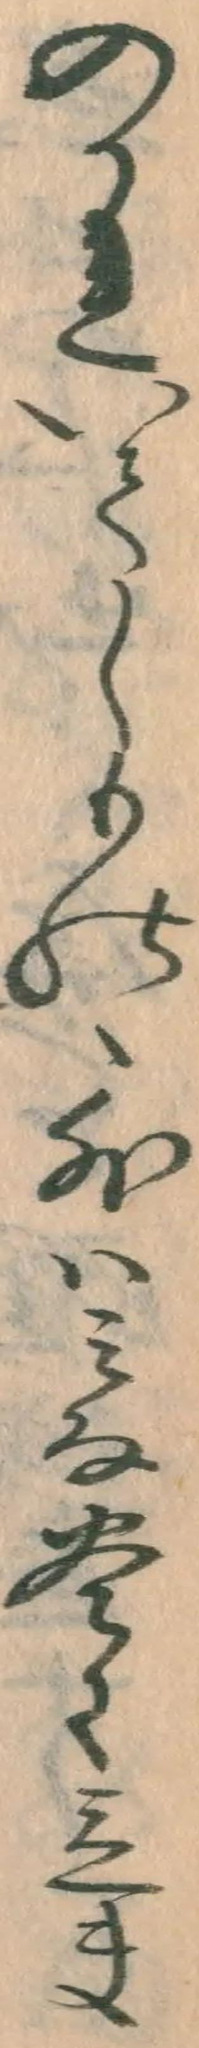のかれいてしものヽ外ハミな炎に立ま
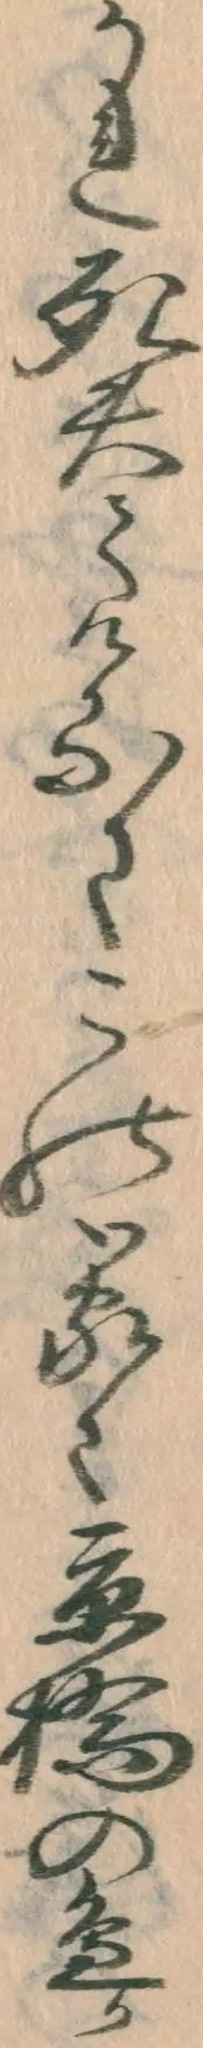かれ死失てけるにこの御家に京橋の邊り
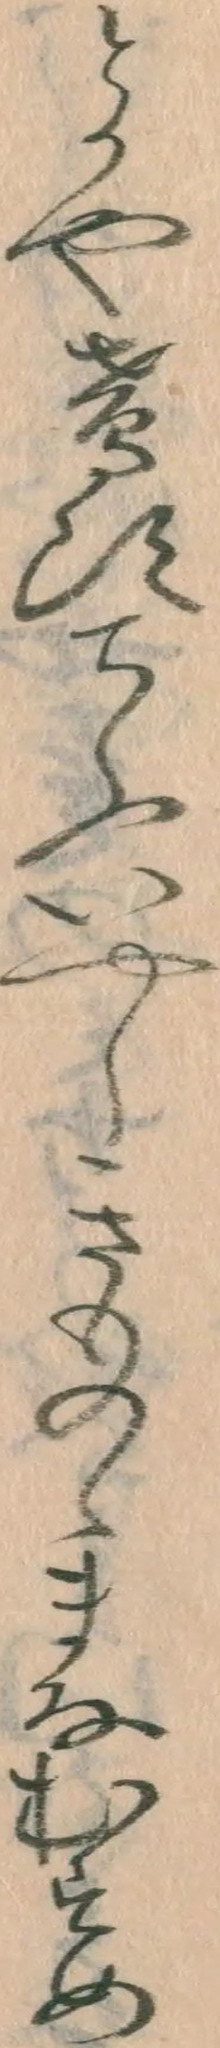とかや鳶頭てふいやしきものゝまなむすめ
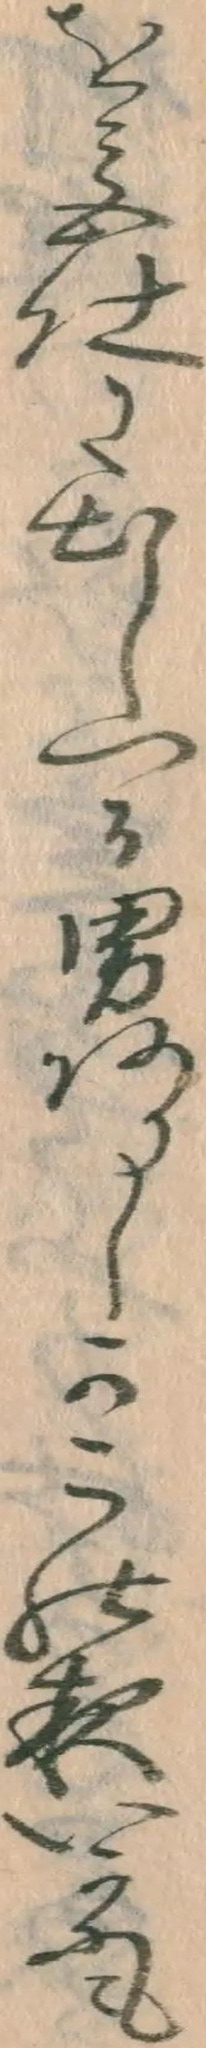を宮仕に出しつる男ありしかこの夜いかにも
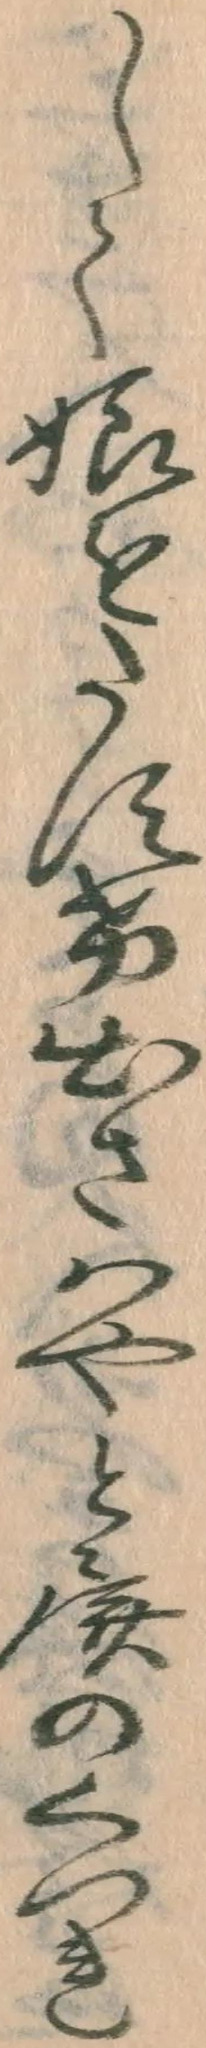して娘をたすけ出さハやと屏のくつれ
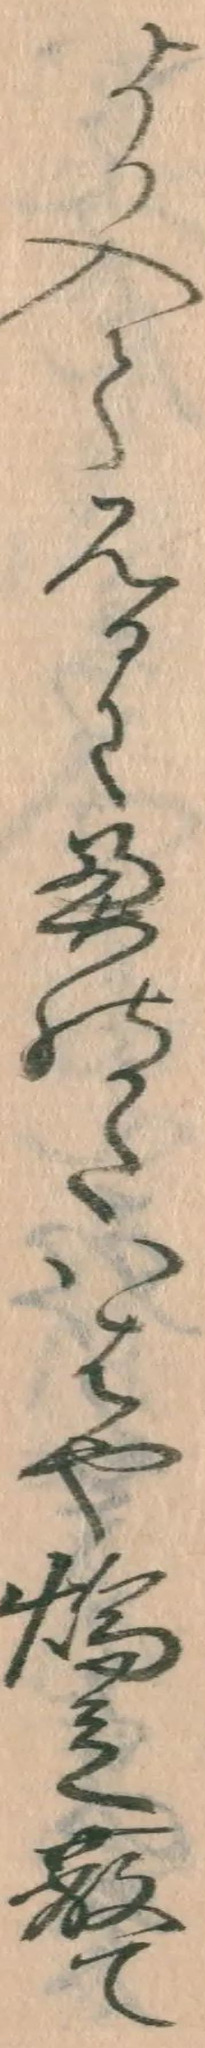より入て見るに奥のかたハはや焰立散て
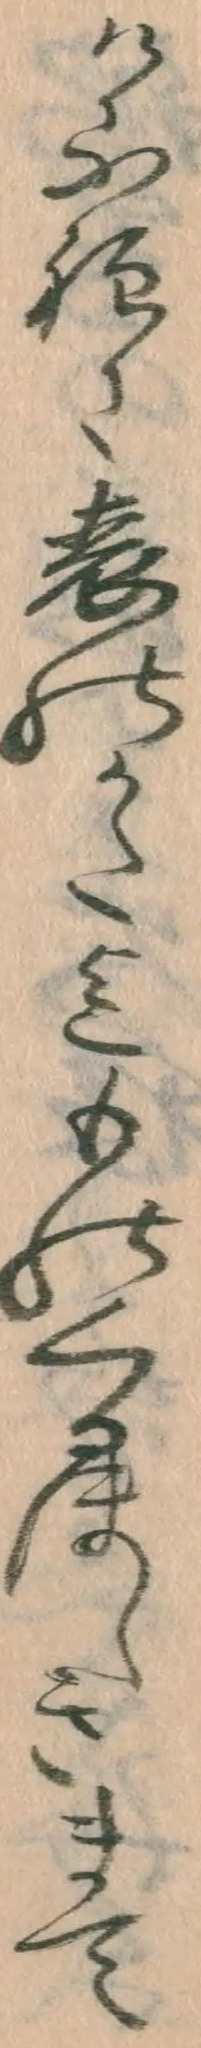ける程に表のかた迄ものくるほしきまて
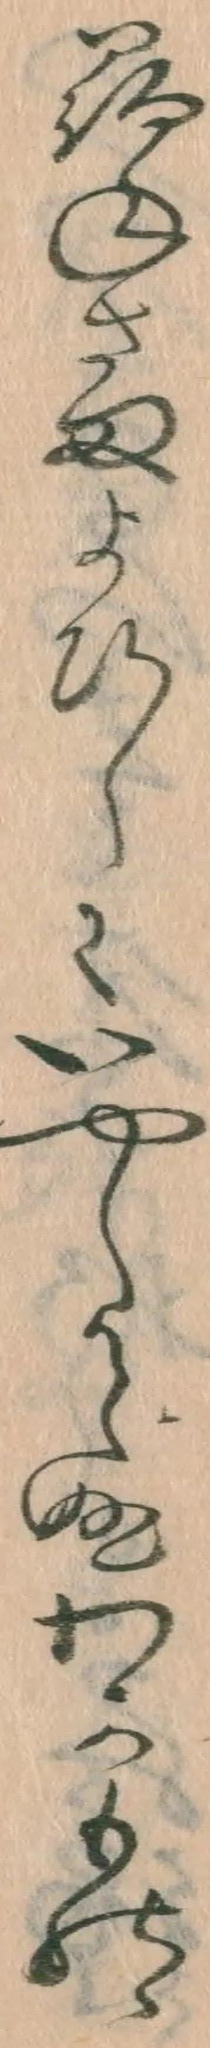尋ねさまよひしにいやしからぬわかものゝ
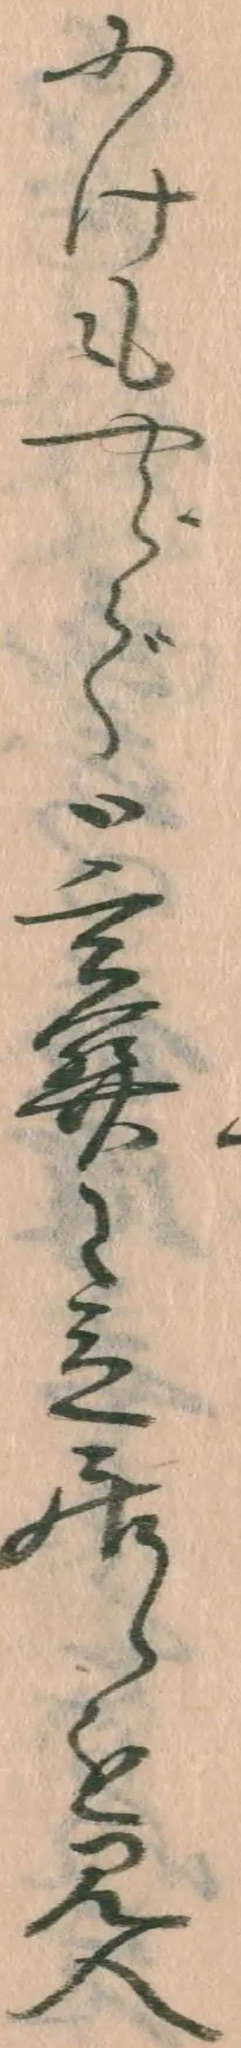にけもやらで御玄関に立居しを見人
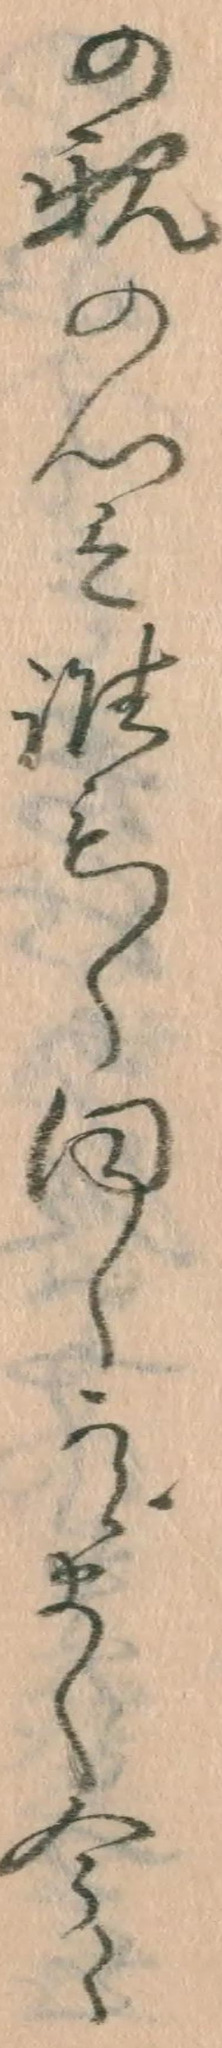の親の心は誰も〳〵同しからまし今に
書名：麗斎叢書. 20
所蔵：国立国会図書館 National Diet Library, JAPAN
